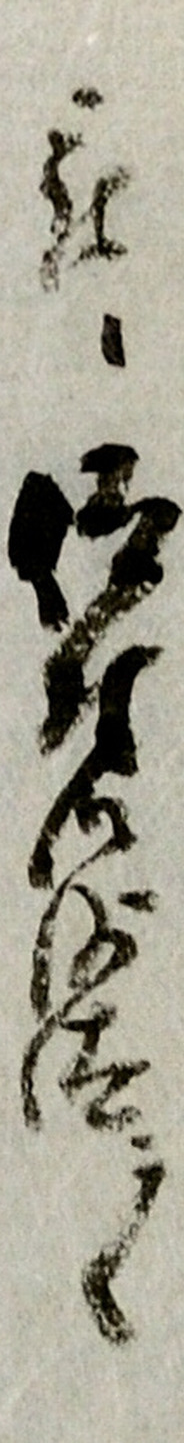被仰付御沙汰ニ候
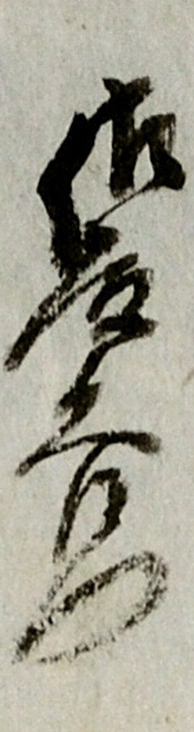佐藤久左衛門
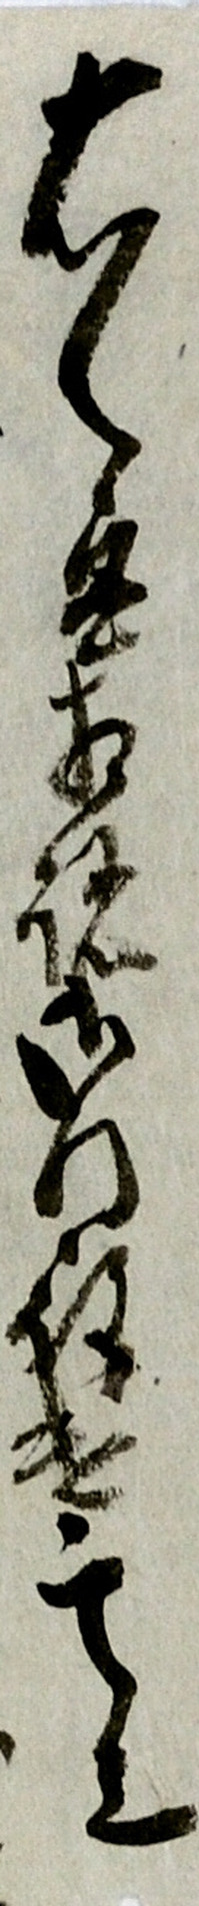右之通相認御同役遣其上
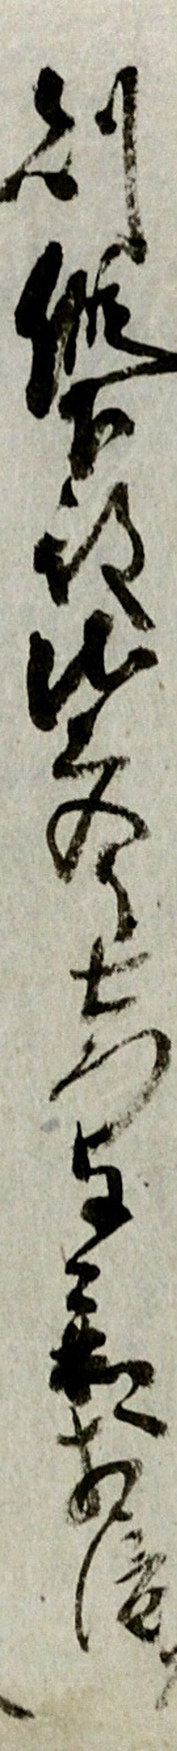則仮下役池上今右衛門与兵衛へ相渡ス
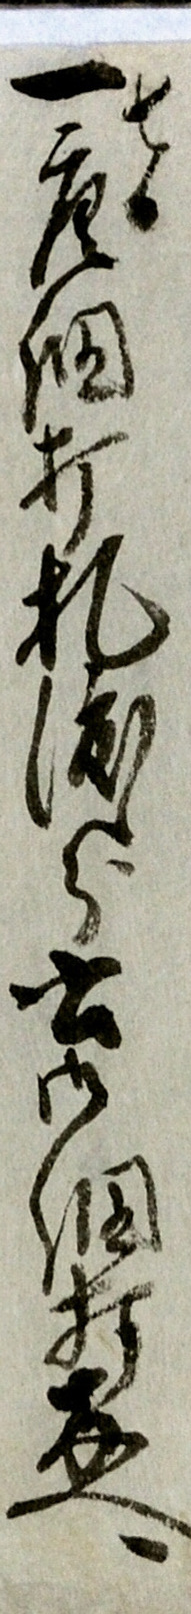一唐網打札渡候分書御網打両人へ
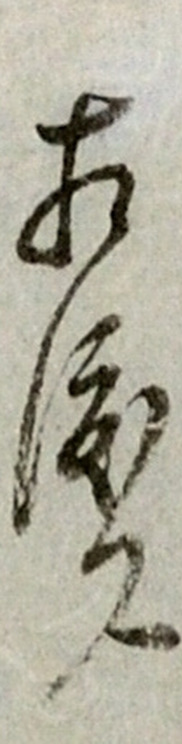相渡ス
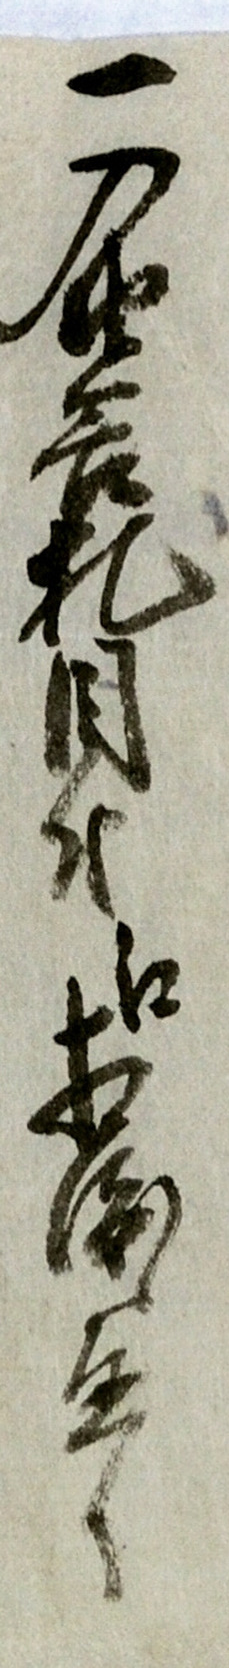一入野谷札目付え相渡候通り
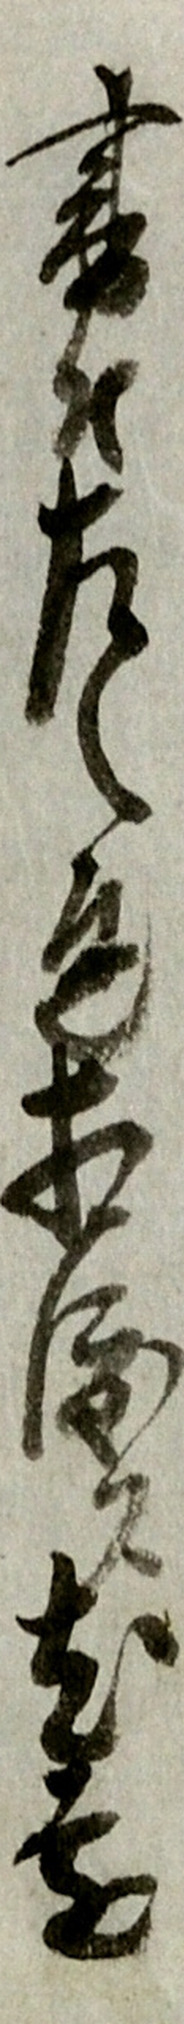書付左之通相渡ス尤遠
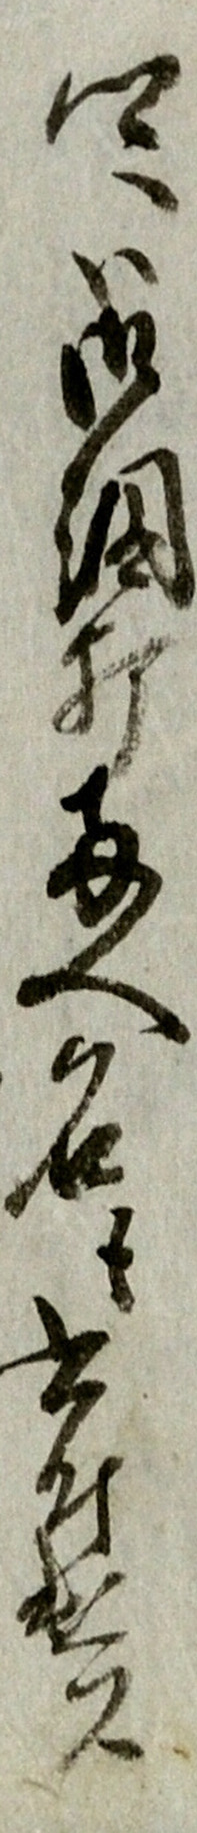郷へハ御網打両人名も書付遣ス
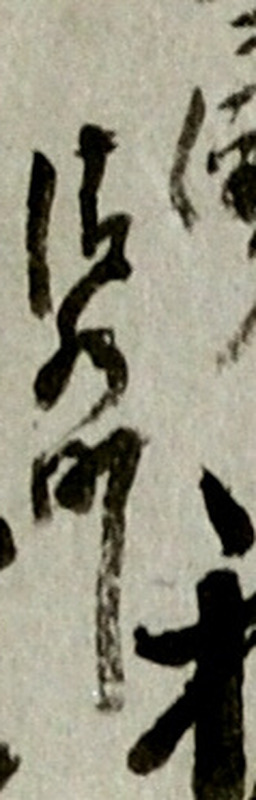清水町
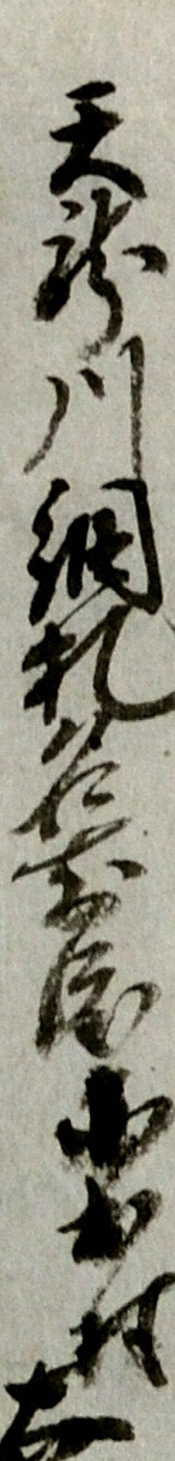天竜川綱札名前渡小出村

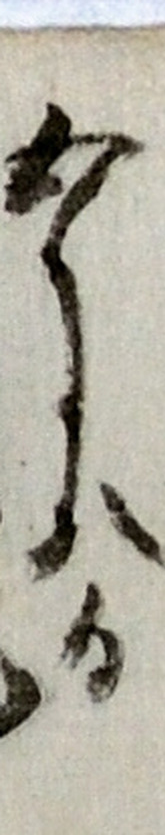五月八日
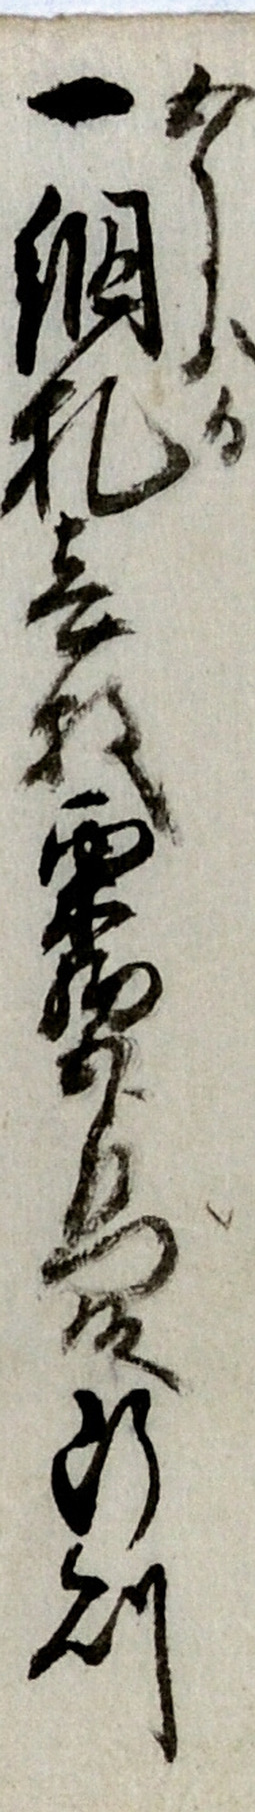一網札壱枚栗五郎左衛門殿改則
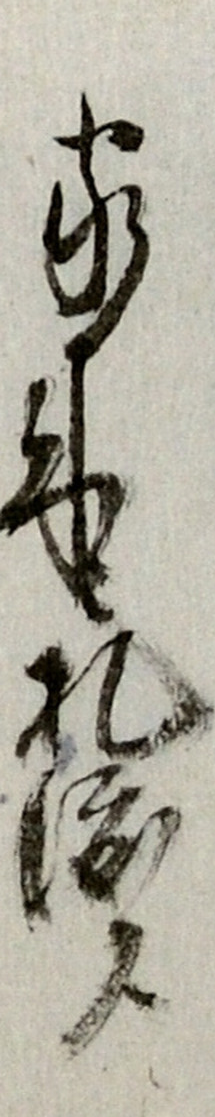家来札渡ス
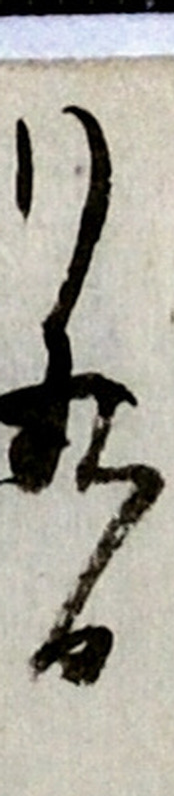同九日
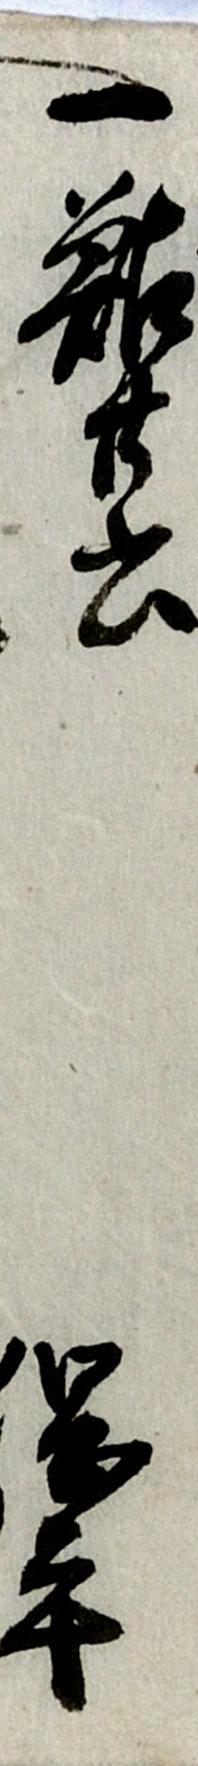一鮎廿六綱平
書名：分一方諸事御用留帳
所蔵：伊那市立高遠町図書館・合同会社AMANE
